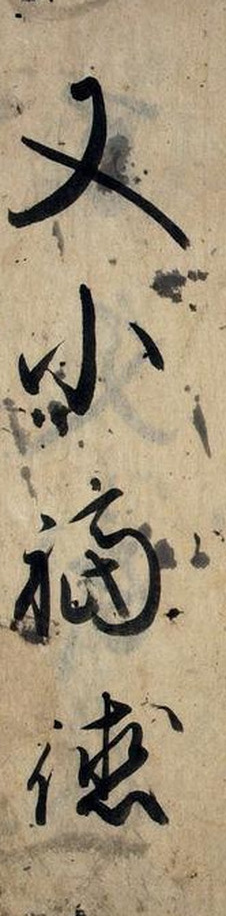又小福徳

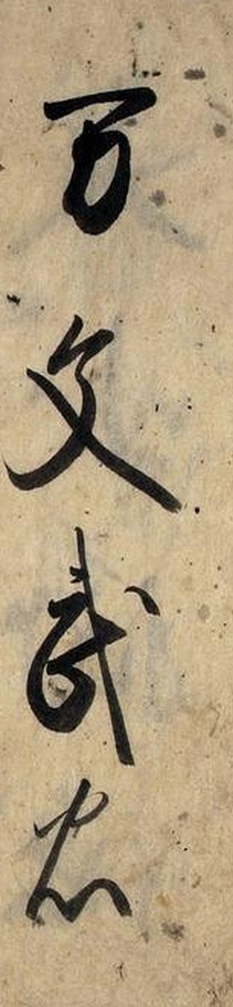万文武右
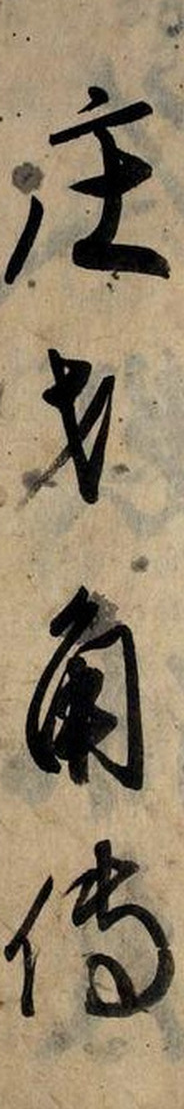庄才角伝
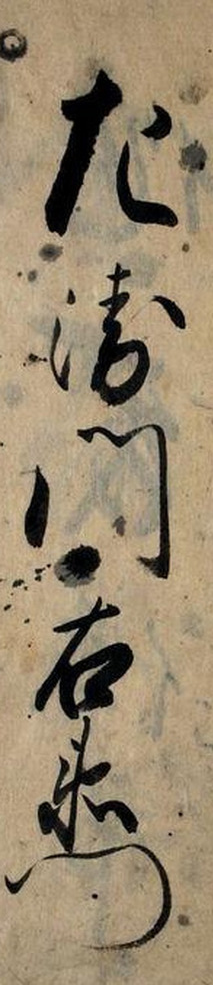左衛門右衛門
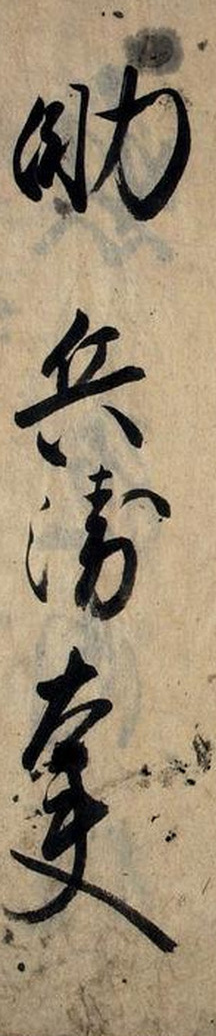助兵衛太夫

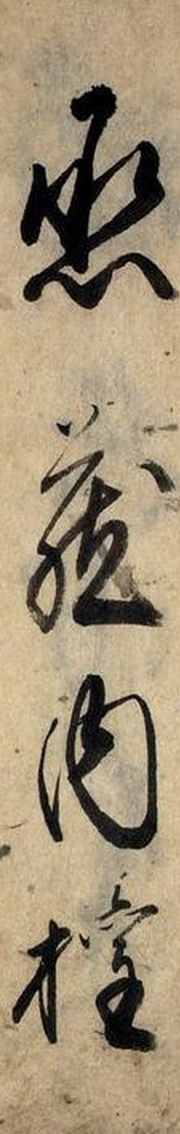丞蔵内権
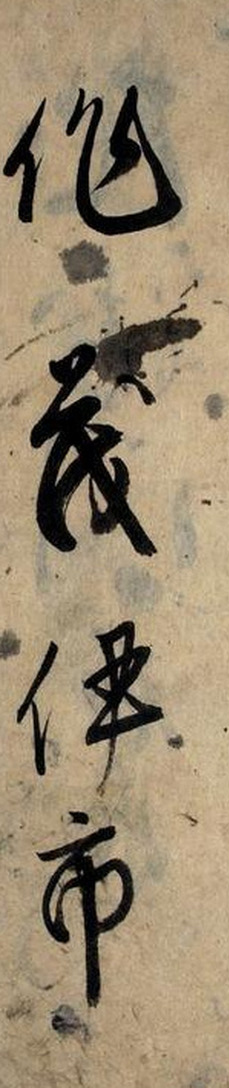作茂伊市
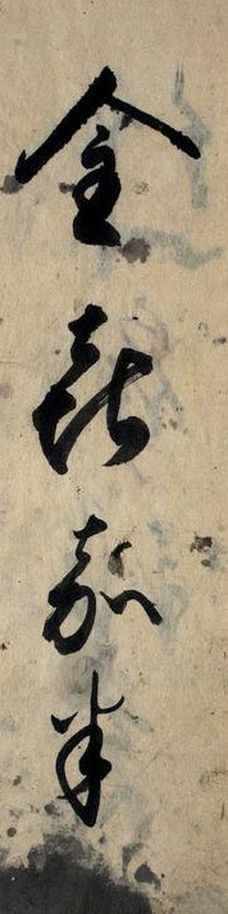金喜嘉半

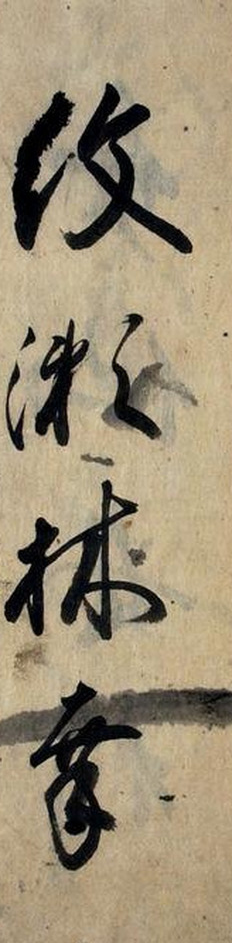紋瀬林幸
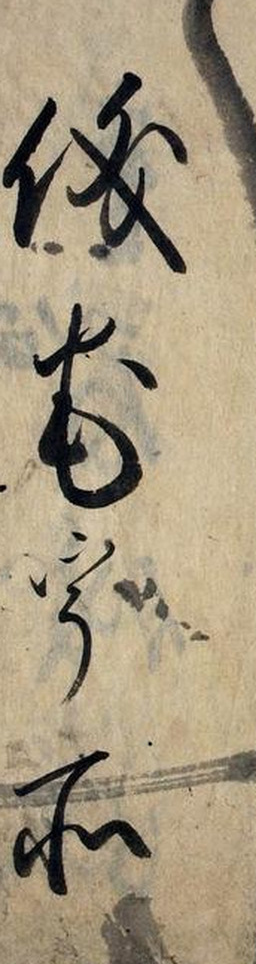儀筆宇所

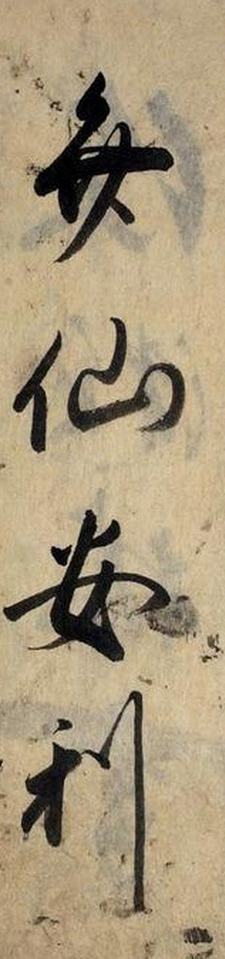弁仙安利
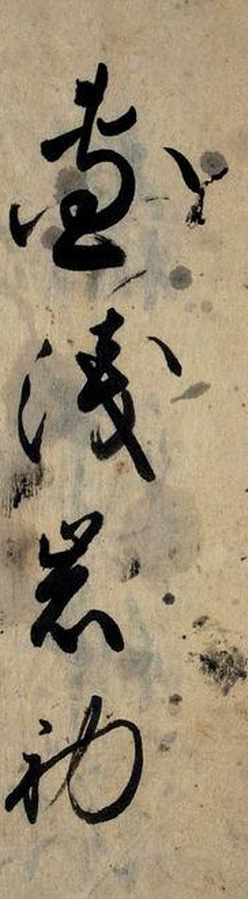団浅岩初

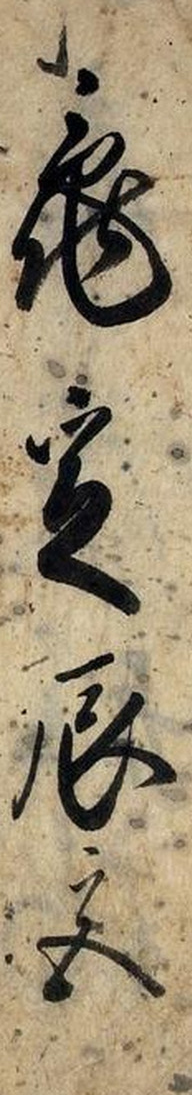亀定辰宮
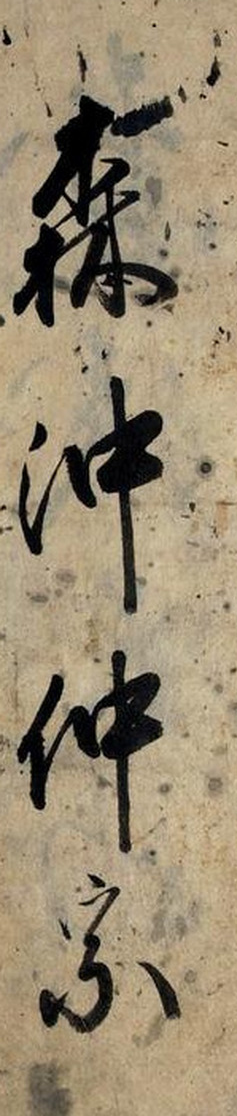盛沖仲宗
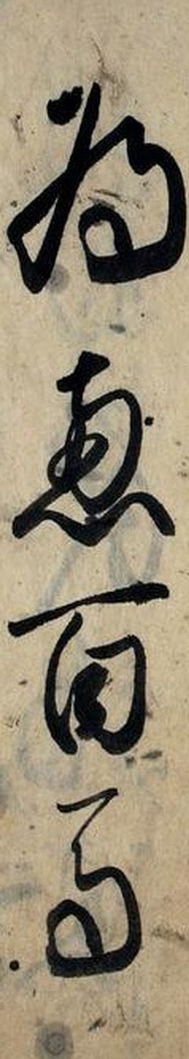為恵百馬
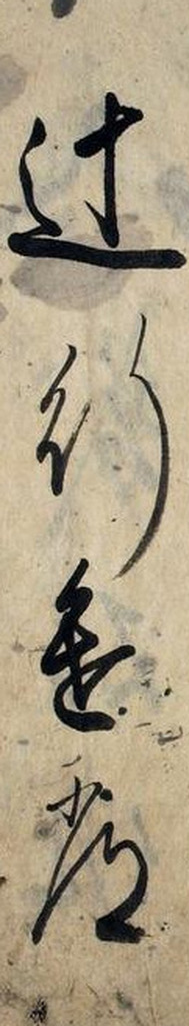辻行遣常
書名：御手本（手習、いろは・数字、「名頭之事」「親戚字尽」「相庭之…
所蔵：福井県文書館 Fukui Prefectural Archives
